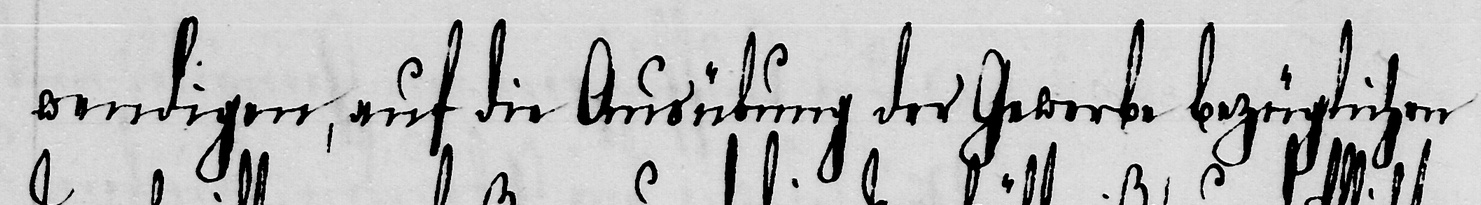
wendigen, auf die Ausübung der Gewerbe bezüglichen
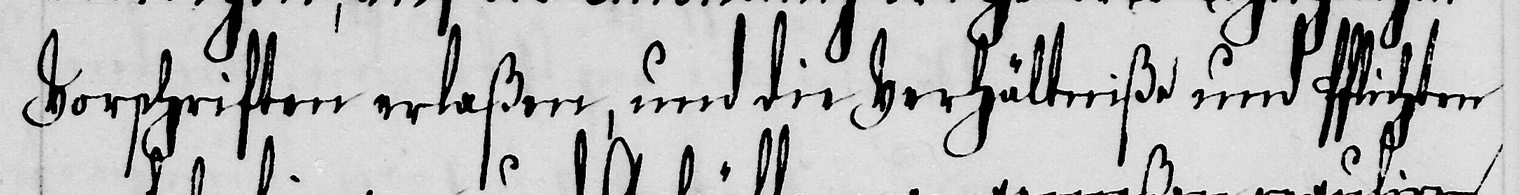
Vorschriften erlaßen, und die Verhältniße und Pflicht¬
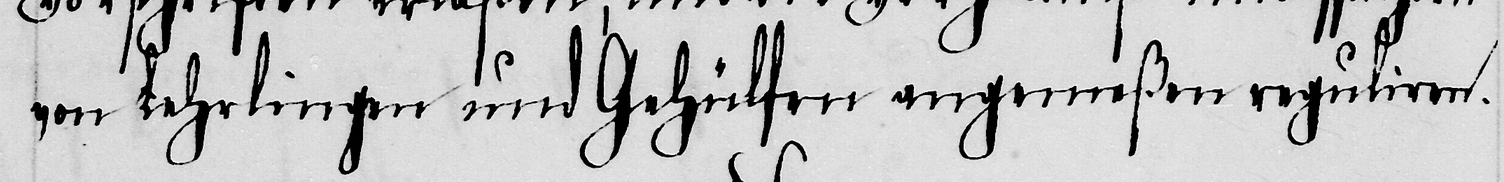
von Lehrlingen und Gehülfen angemeßen reguliren.
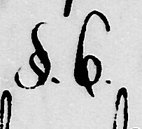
§. 6.
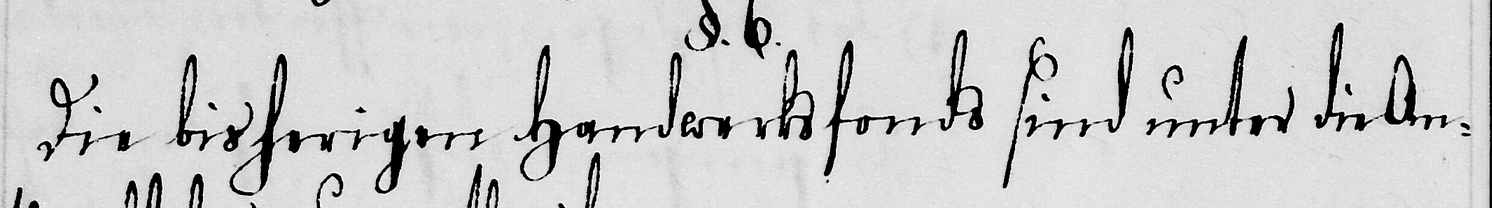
Die bisherigen Handwerksfonds sind unter die An¬
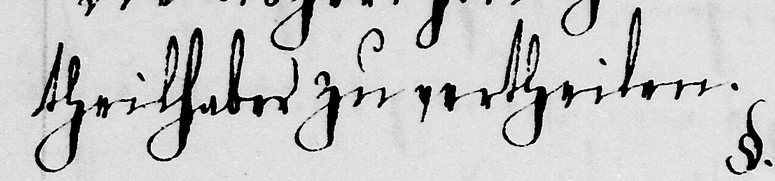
theilhaber zu vertheilen.
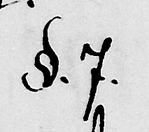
§. 7.
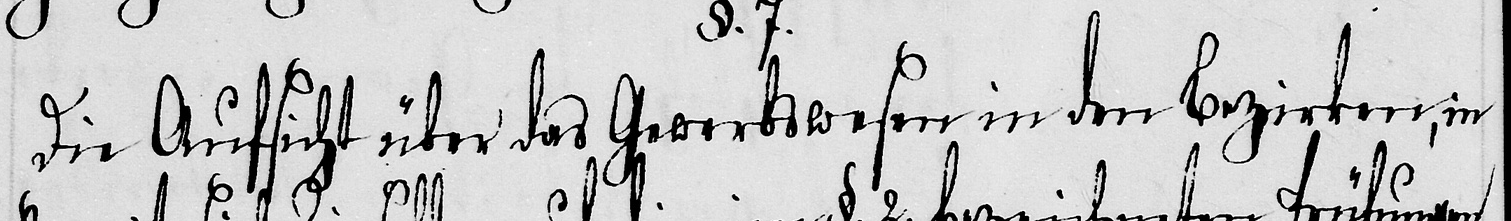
Die Aufsicht über das Gewerbswesen in den Bezirken, in
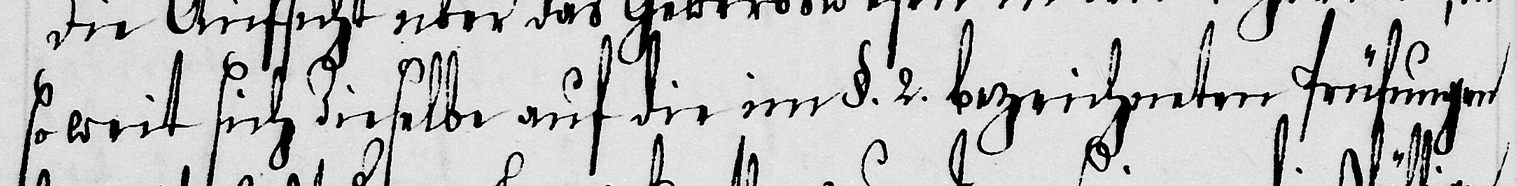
soweit sich dieselbe auf die im §. 2. bezeichneten Prüfungen
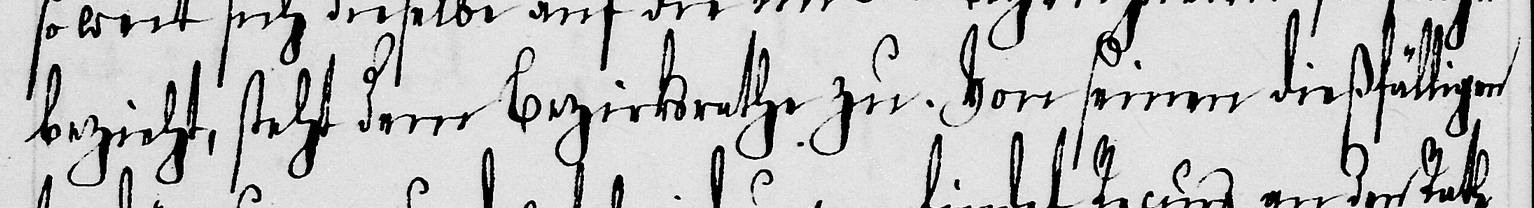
bezieht, steht dem Bezirksrath zu. Von seinen dießfälligen
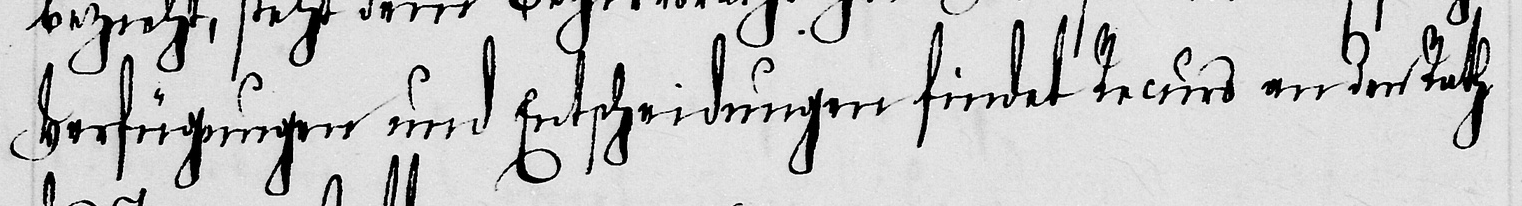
Verfügungen und Entscheidungen findet Recurs an den Rath
